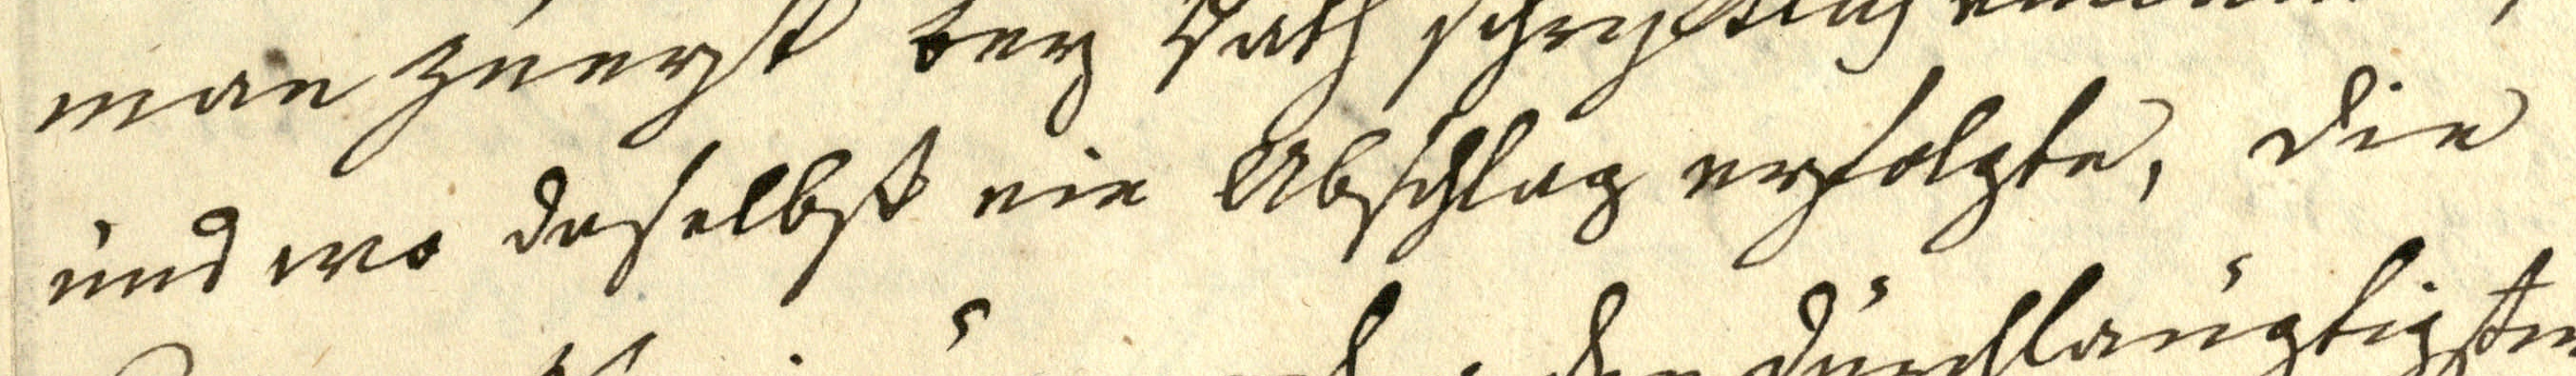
und wo daselbst ein Abschlag erfolgte, die
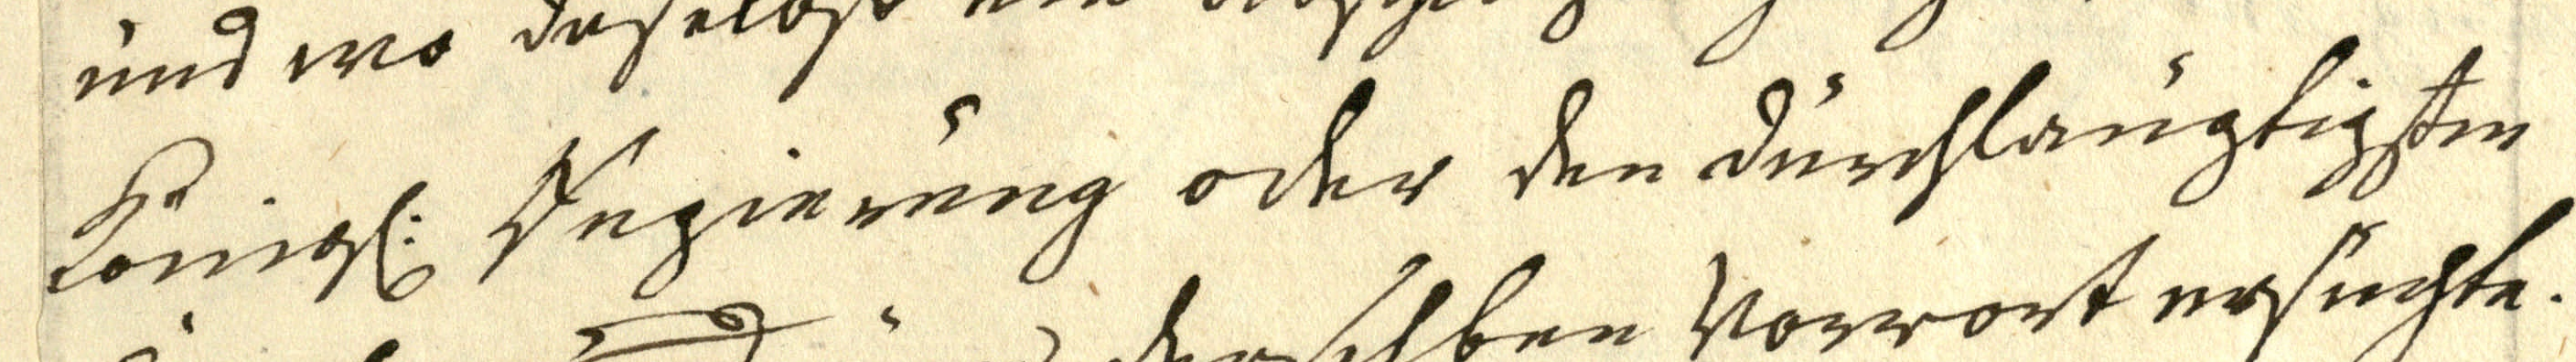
Königl. Regierung oder den durchlaugtigsten
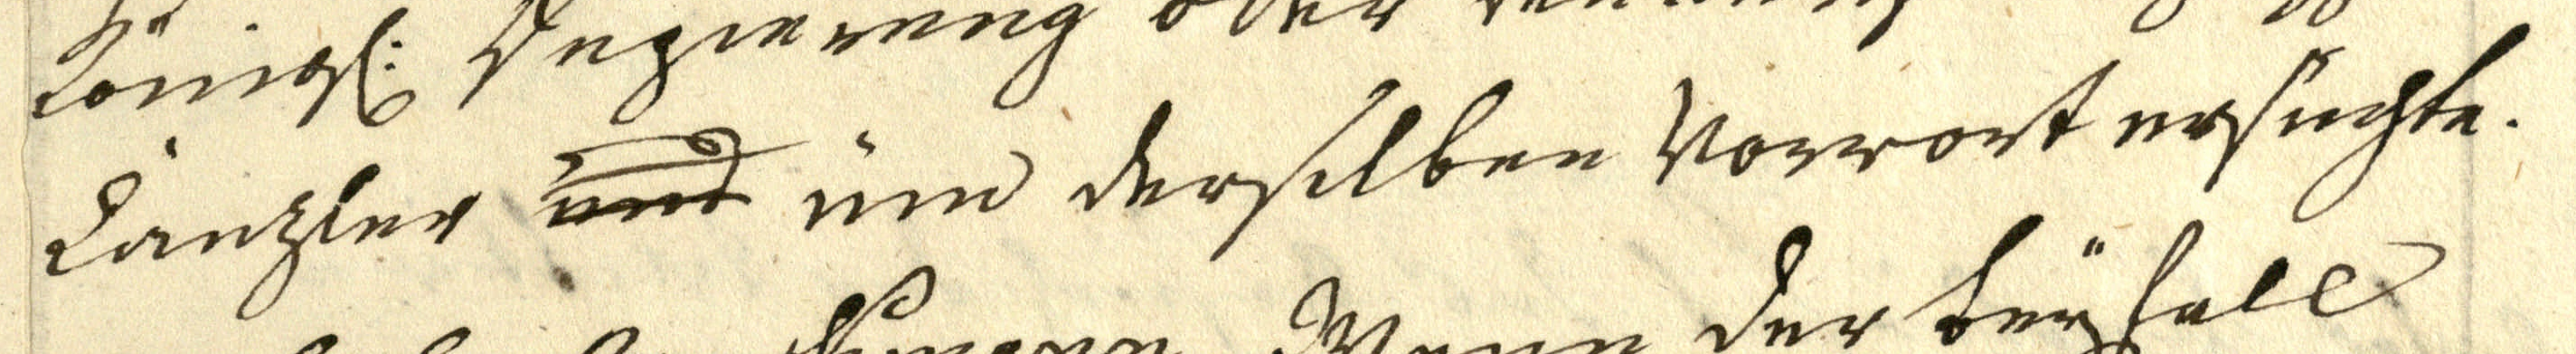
Canzler und um derselben Vorwort ersuchte.
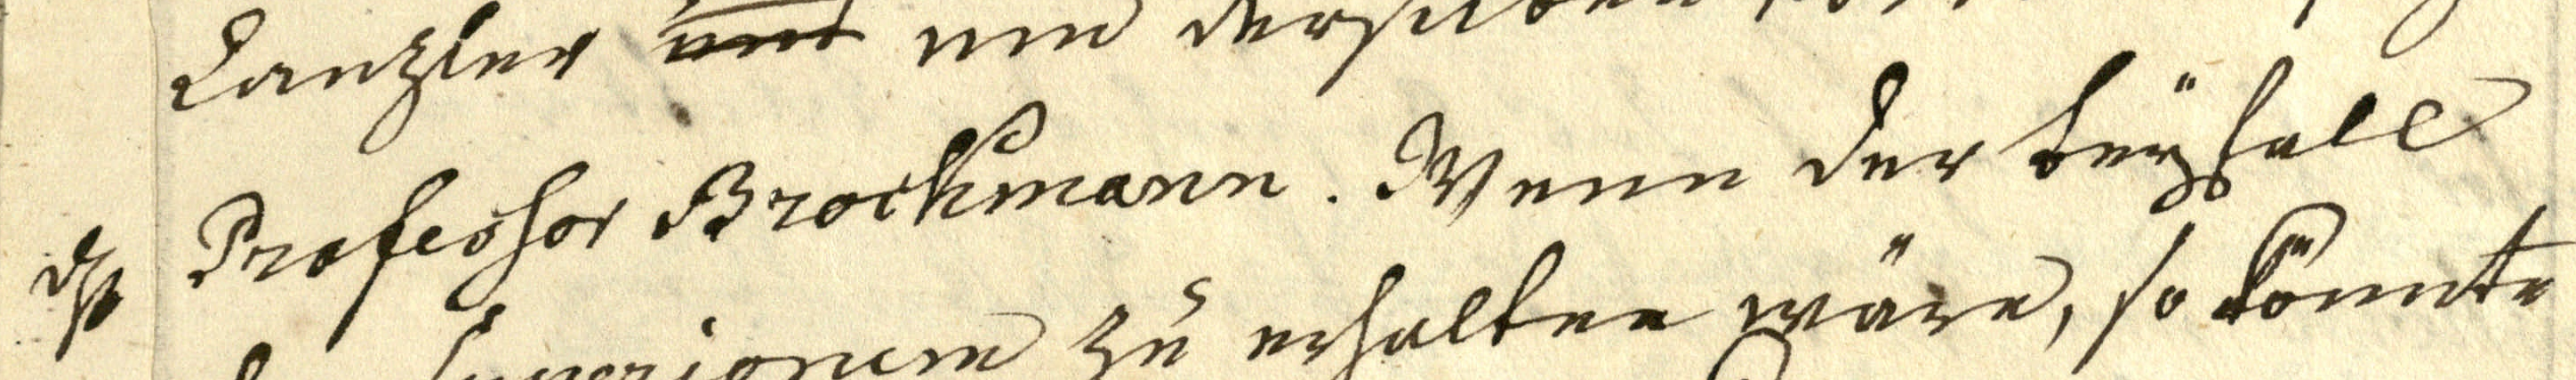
dh Professor Brockmann. Wenn der Beÿfall
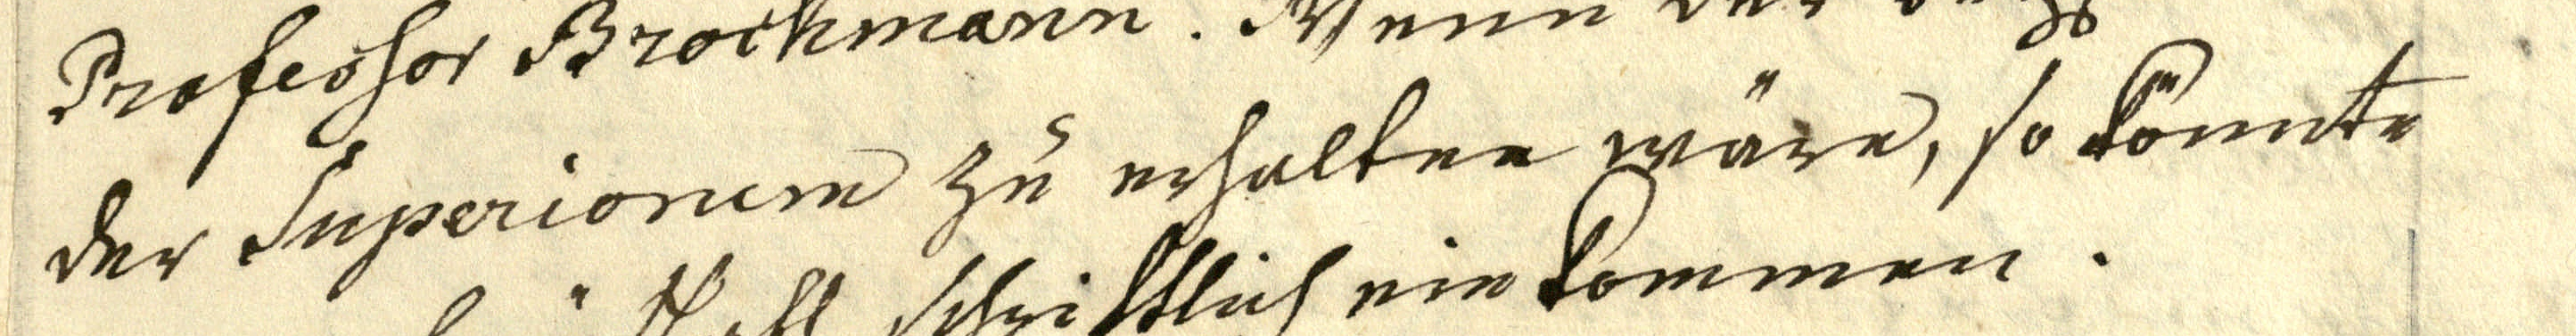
der Superiorum zu erhalten wäre, so könnte
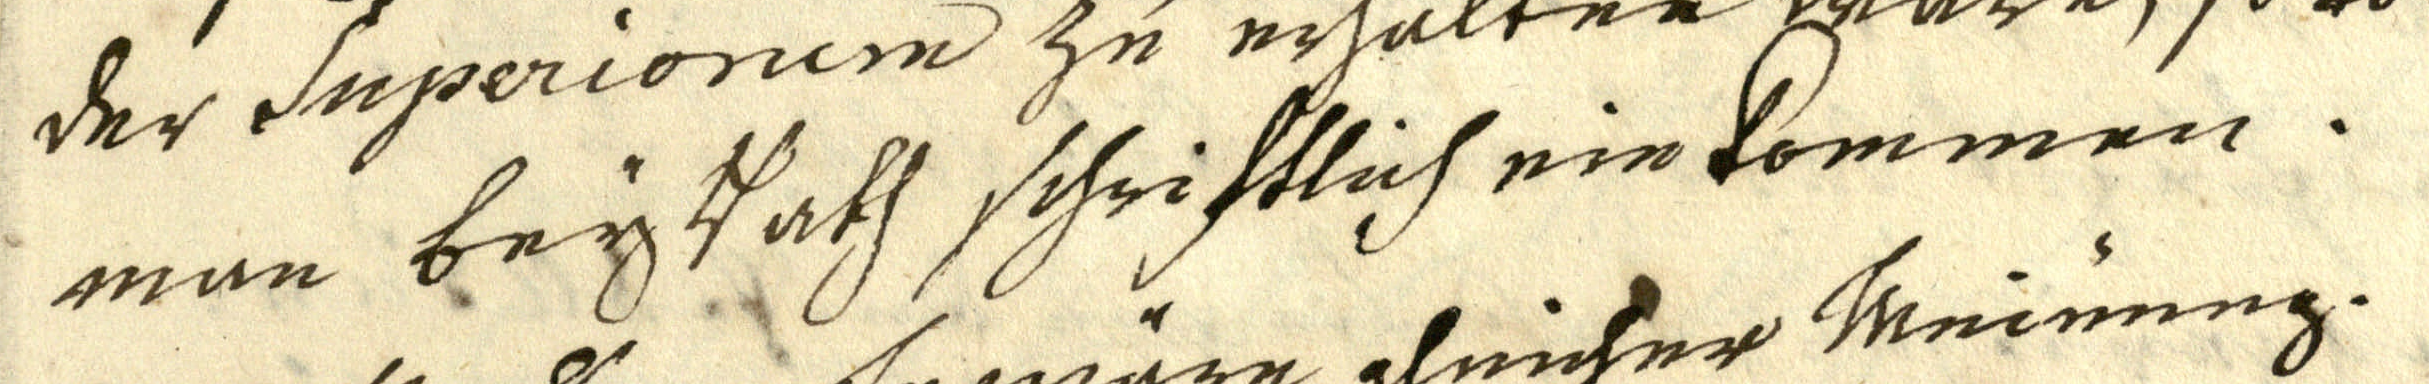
man beÿ Rath schriftlich einkommen.
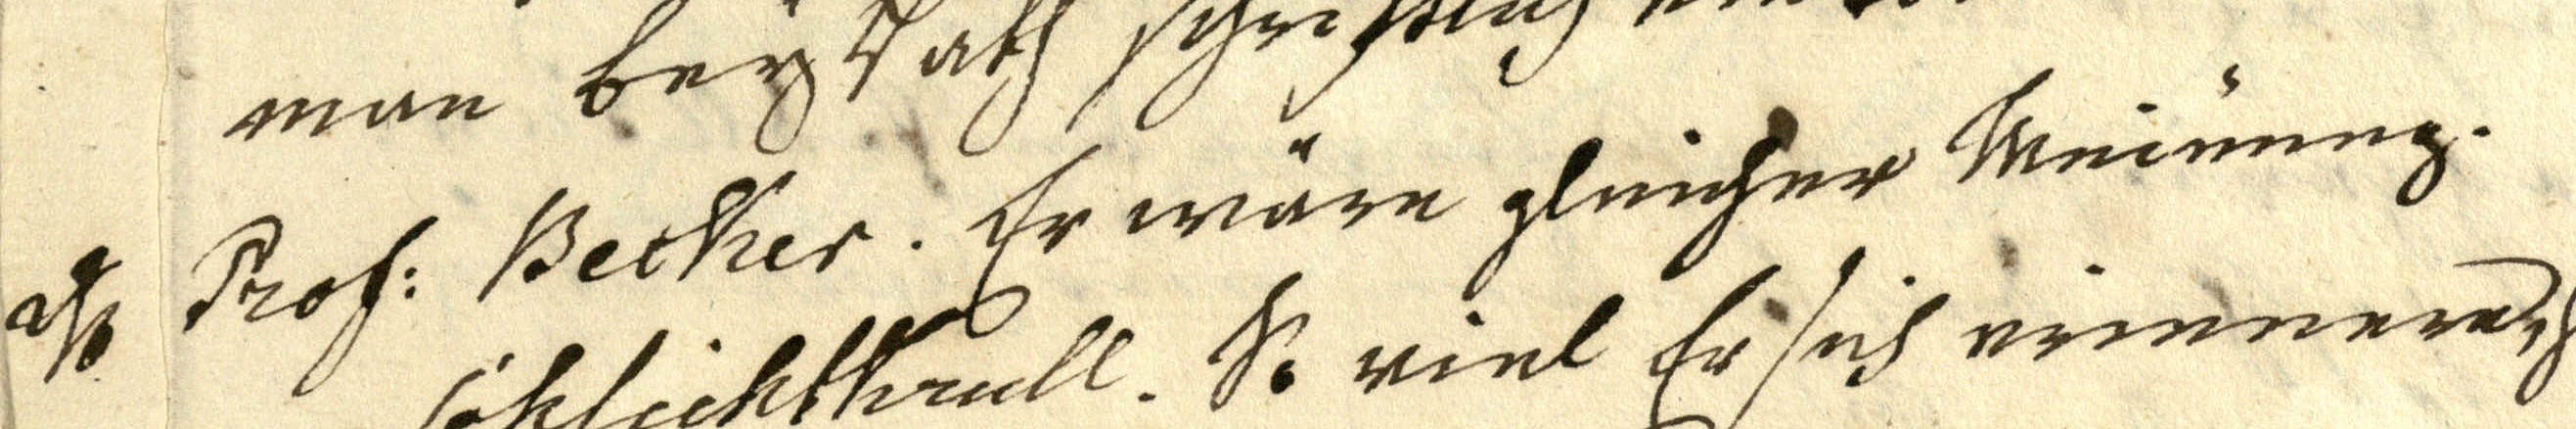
dh Prof. Becker. Er wäre gleicher Meinung.
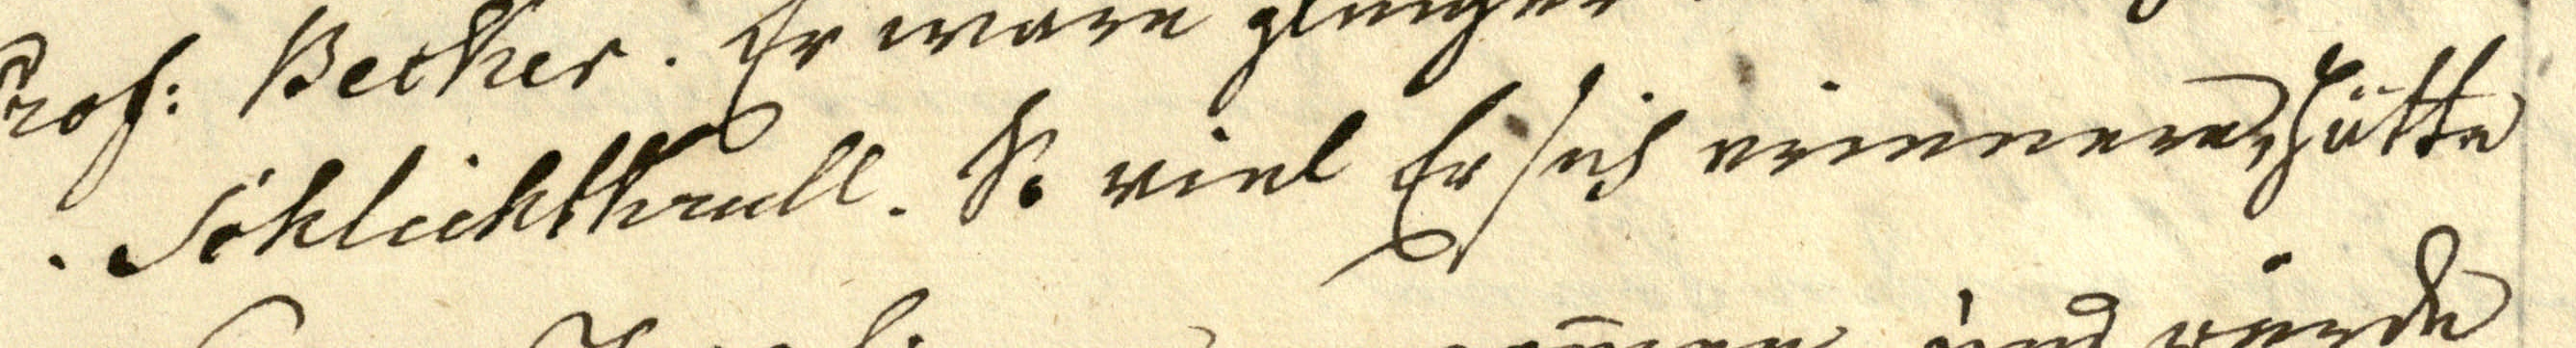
Schlichtkrull. So viel Er sich erinnere, hätte
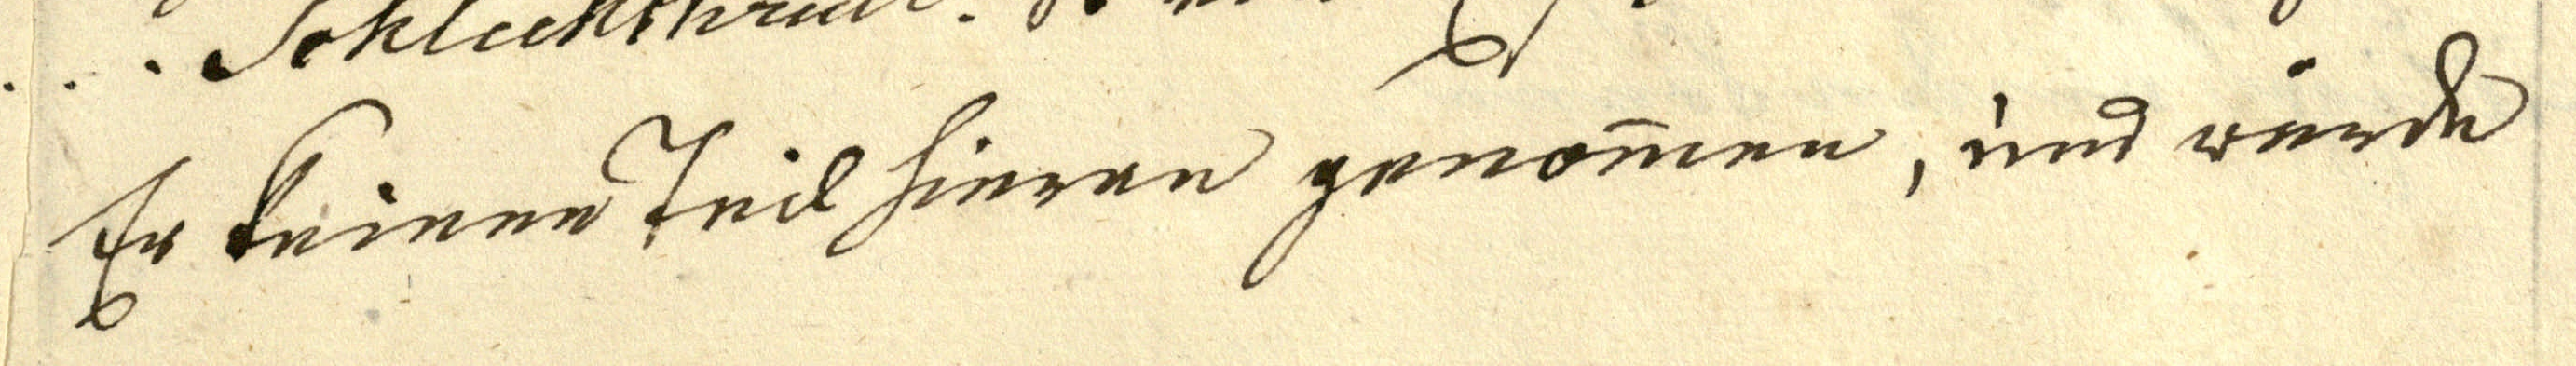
Er keinen Teil hieran genomen, und würde
